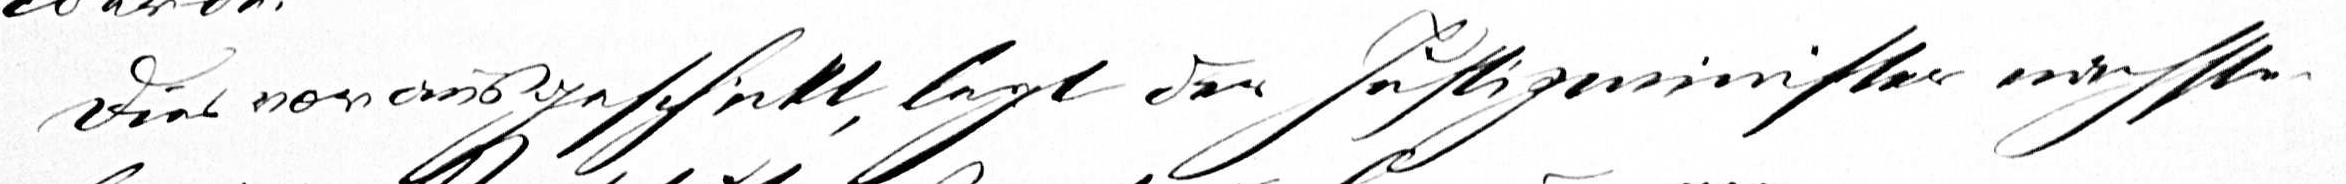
Dies vorausgeschickt, legt der Justizminister nachste¬
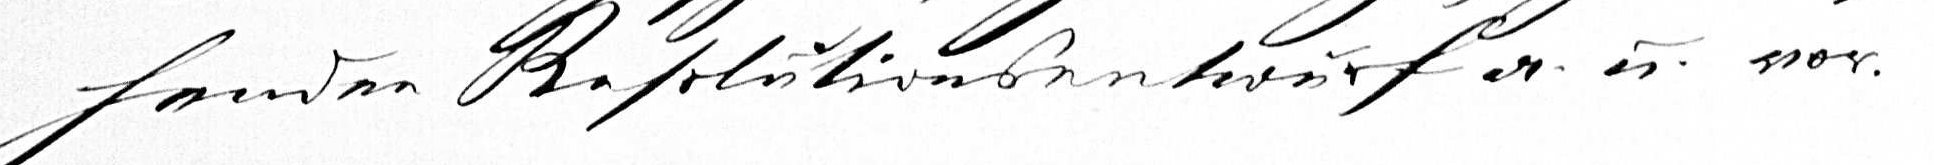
henden Resolutionsentwurf a. u. vor.
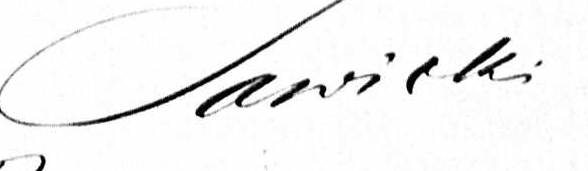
Sawicki
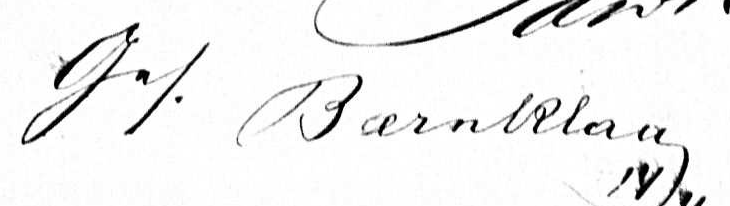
Ges. Bernklau
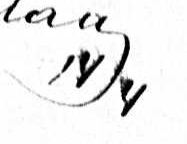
14/4
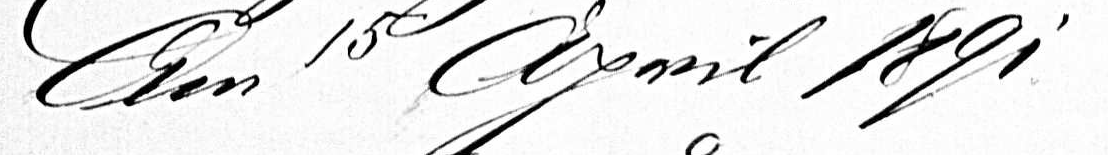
Am. 15 April 1891
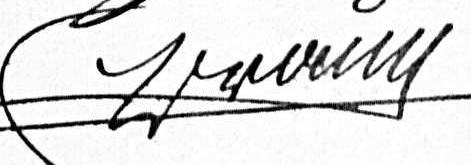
Wraun
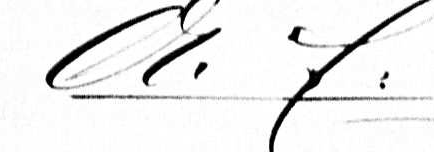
A.E.
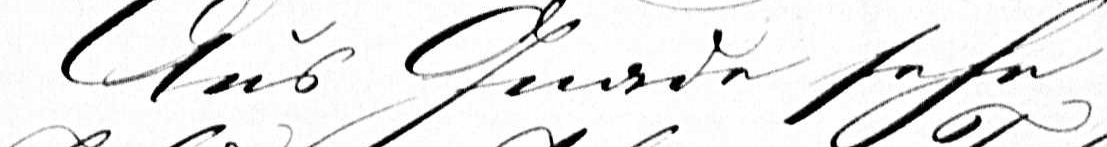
Aus Gnade sehe
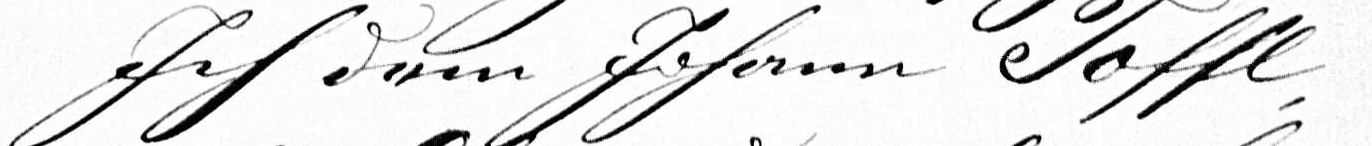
Ich dem Johann Toffl
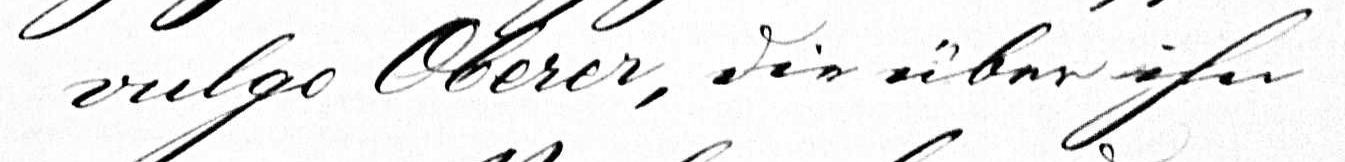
vulgo Oberer, die über ihn
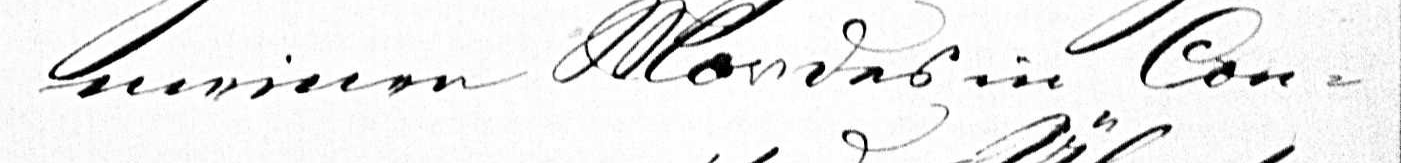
meinen Mordes in Con¬
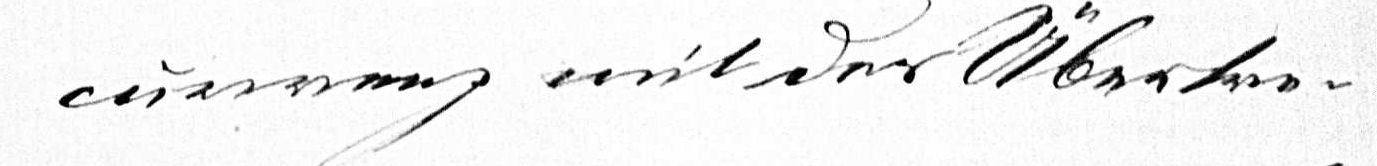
currenz mit der Übertre¬
